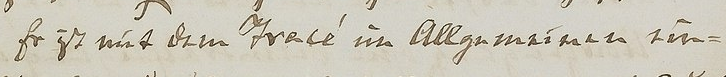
Er ist mit dem Tracé im Allgemeinen ein-
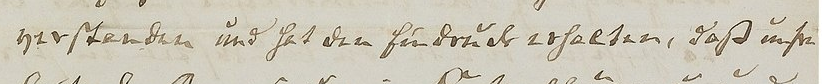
verstanden und hat den Eindruck erhalten, daß unsre
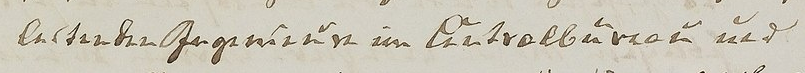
leitenden Ingenieure im Centralbureau und
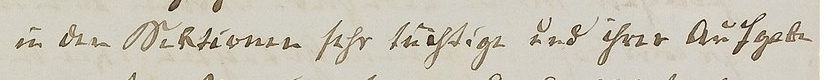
in den Sektionen sehr tüchtig und ihrer Aufgabe
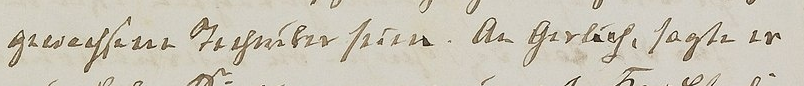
gewachsene Techniker seien. An Gerlich, sagte er
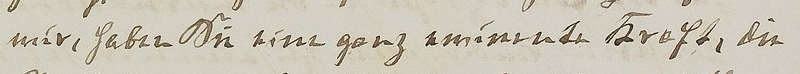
mir, haben Sie eine ganz eminente Kraft, die
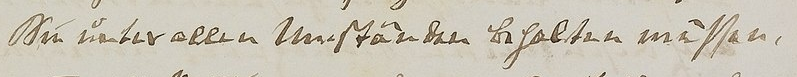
Sie unter allen Umständen behalten müssen,
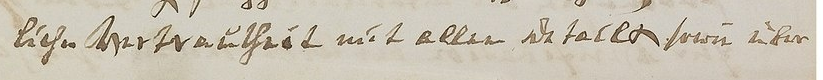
liche Vertrautheit mit allen Details sowie über
